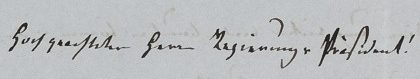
Hochgeachteter Herr Regierungs Präsident!
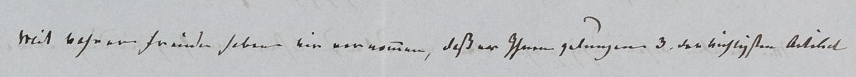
Mit wahrer Freude haben wir vernommen, daß es Ihnen gelungen 3. der wichtigsten Artikel
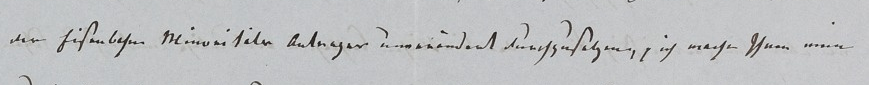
des Eisenbahn Minoritäts Antrages unverändert durchzusetzen, & ich mache Ihnen mein
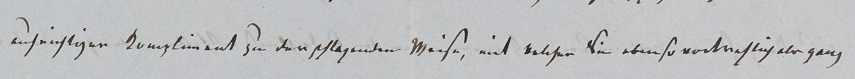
aufrichtiges Kompliment zu der schlagenden Weise, mit welcher Sie ebenso vortrefflich als ganz
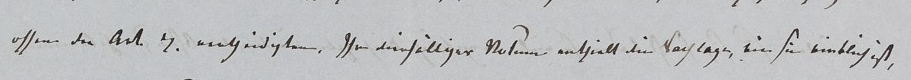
offen den Art. 7. vertheidigten. Ihr diesfälliges Votum enthielt die Sachlage, wie sie wirklich ist,
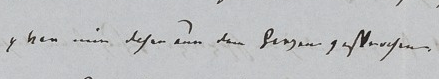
& war mir daher aus dem Herzen gesprochen.
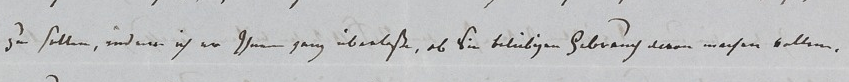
zu sollen, indem ich es Ihnen ganz überlaße, ob Sie beliebigen Gebrauch davon machen wollen.
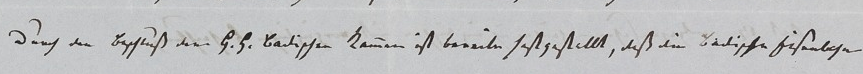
Durch den Beschluß der G.H. Badischen Kammern ist bereits festgestellt, daß die Badische Eisenbahn
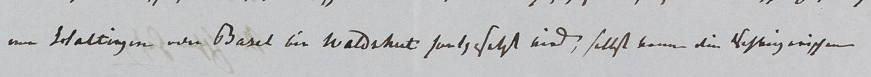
von Haltingen oder Basel bis Waldshut fortgesetzt wird, selbst wenn die Schweizerischen
